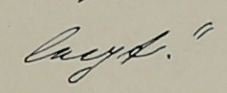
legt.“
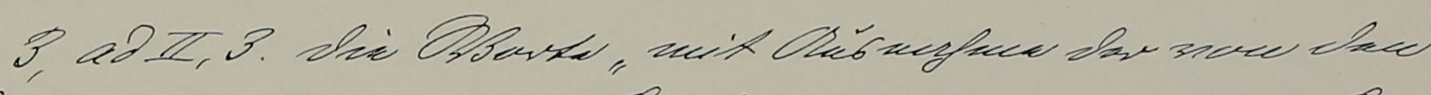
3. ad II,3. die Worte „mit Ausnahme der von den
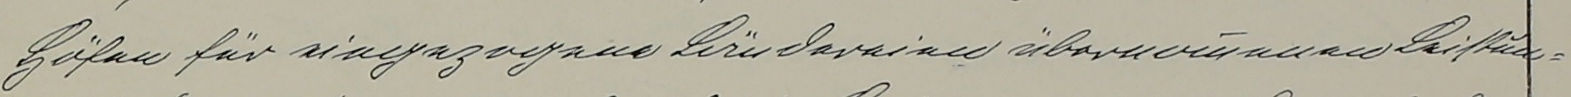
Höfen für eingezogene Ländereien übernommenen Leistun-
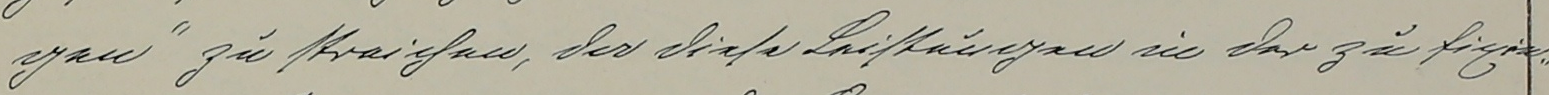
gen“ zu streichen, da diese Leistungen in der zu fixie-
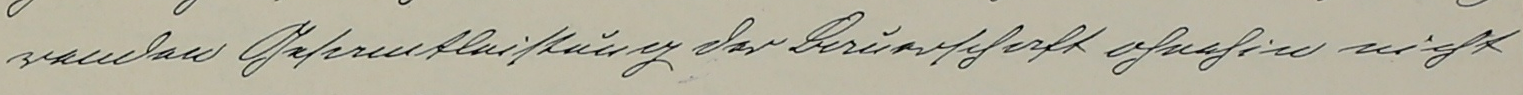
renden Gesamtleistung der Bauerschaft ohnehin nicht
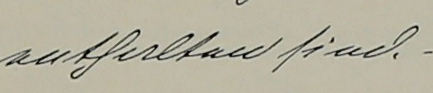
enthalten sind.
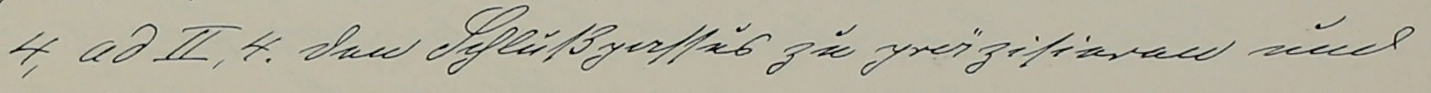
4. ad II,4. den Schlußpassus zu präzisieren und
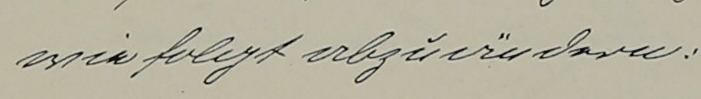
wie folgt abzuändern:
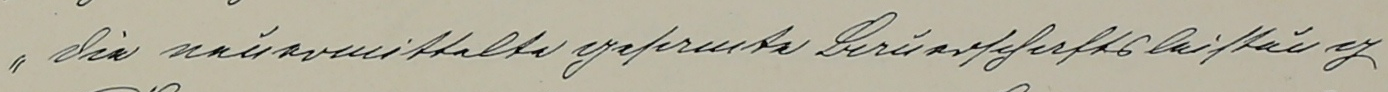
„die neuermittelte gesamte Bauerschaftsleistung
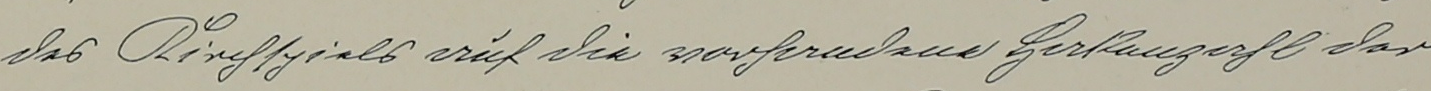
des Kirchspiels auf die vorhandene Hakenzahl der
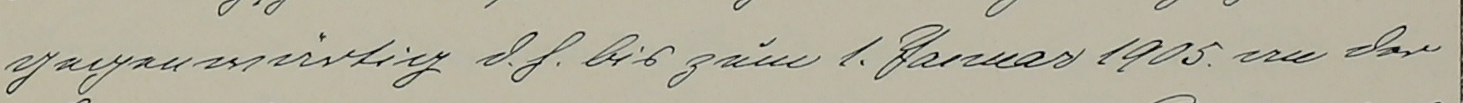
gegenwärtig, d.h. bis zum 1. Januar 1905. an der
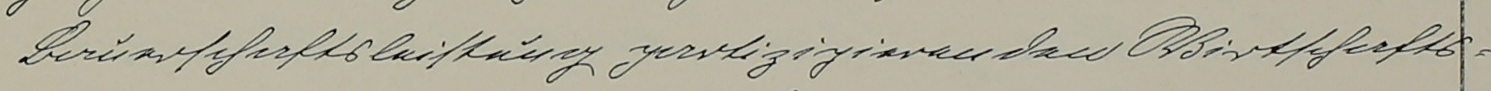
Bauerschaftsleistung partizipierenden Wirtschafts-
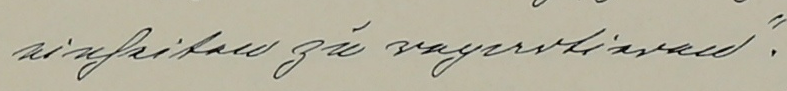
einheiten zu repartieren“.
